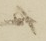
zu einem
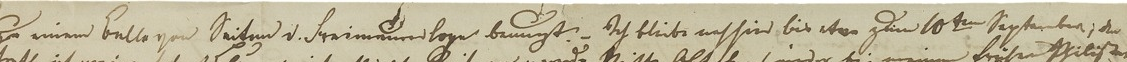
Seiten d. Freimaurerloge benuzt. – Ich bleibe noch hier bis etwa zum 10ten
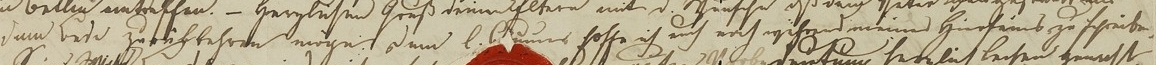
dem Bade zurükkehren möge. Dem l. Blumer hoffe ich auch noch während meines Hierseins zu schreiben.
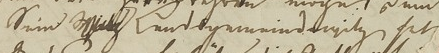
Sein Witz Landsgemeindewitz hat
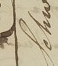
d.
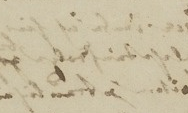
guten
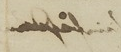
lachen
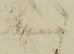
gemacht.
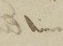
deinem
